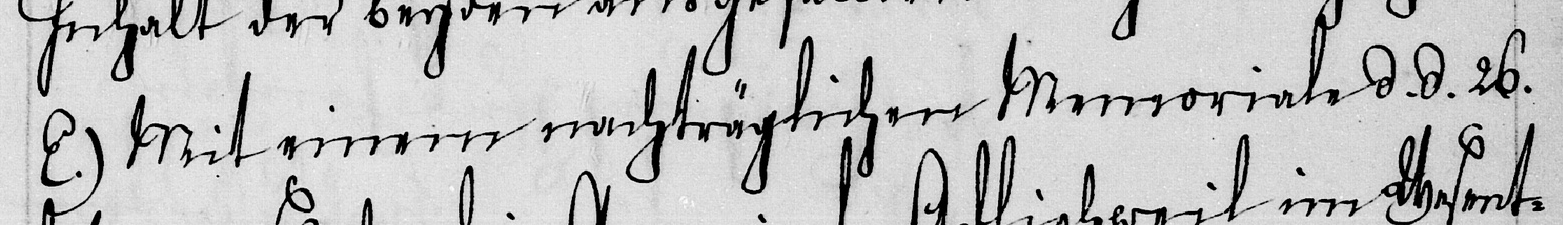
E.) Mit einem nachträglichen Memoriale d. d. 26.
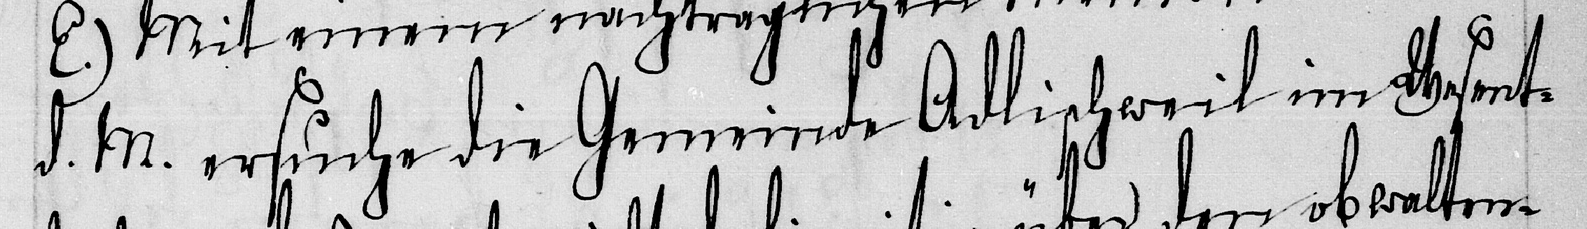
d. M. ersuche die Gemeinde Adlischweil im Wesent¬
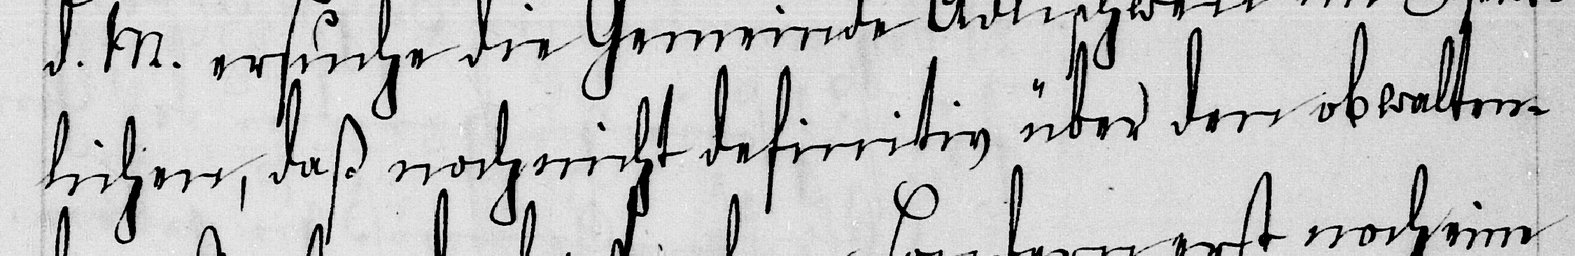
lichen, daß noch nicht definitiv über den obwalten¬
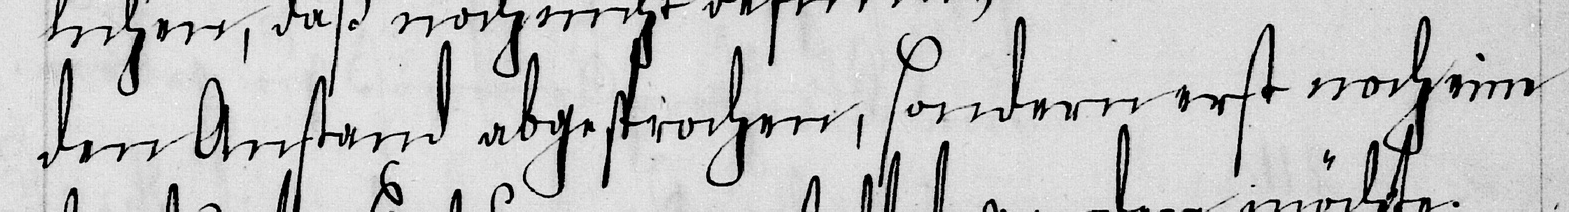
den Anstand abgesprochen, sondern erst noch eine
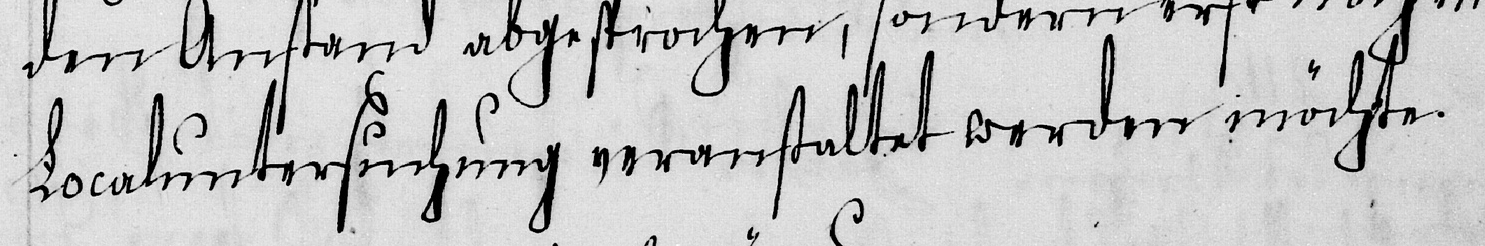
Localuntersuchung veranstaltet werden möchte.
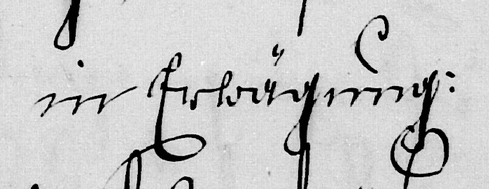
in Erwägung:
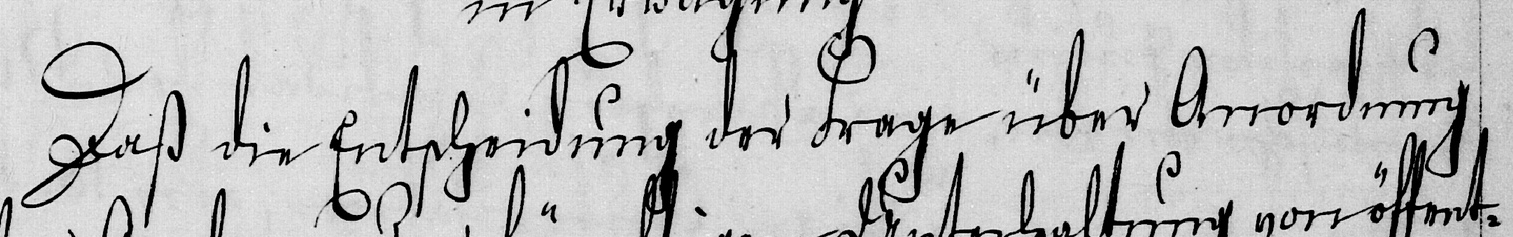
Daß die Entscheidung der Frage über Anordnung
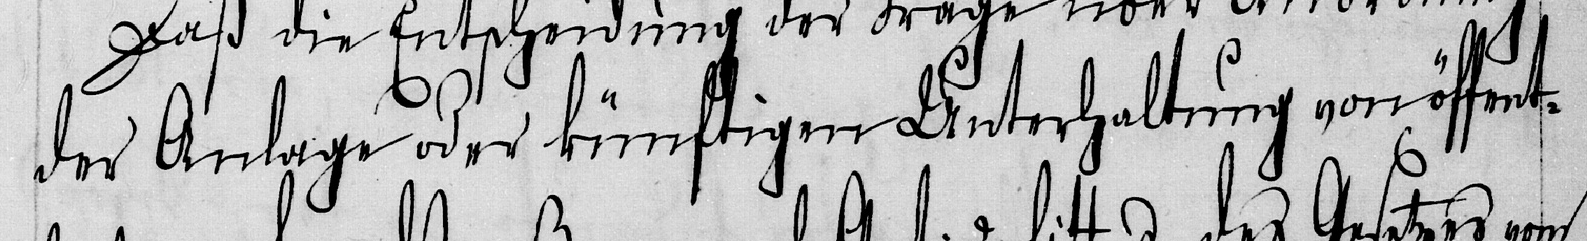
der Anlage oder künftigen Unterhaltung von öffen¬
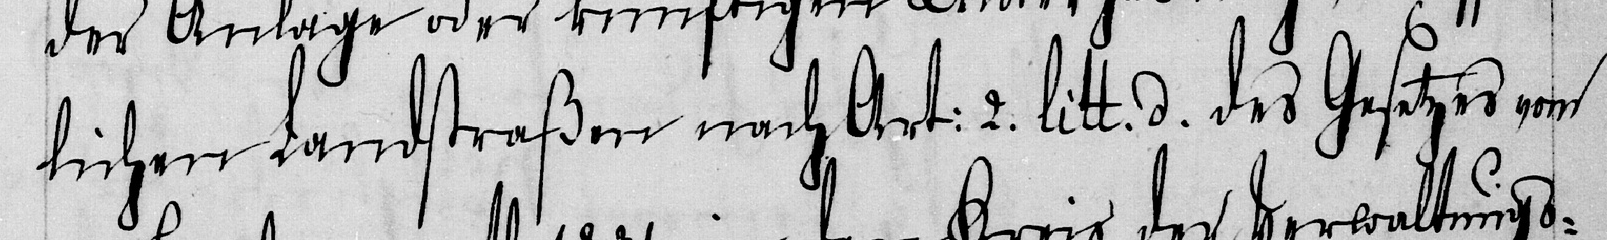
tlichen Landstraßen nach Art: 2. litt. d. des Gesetzes vom
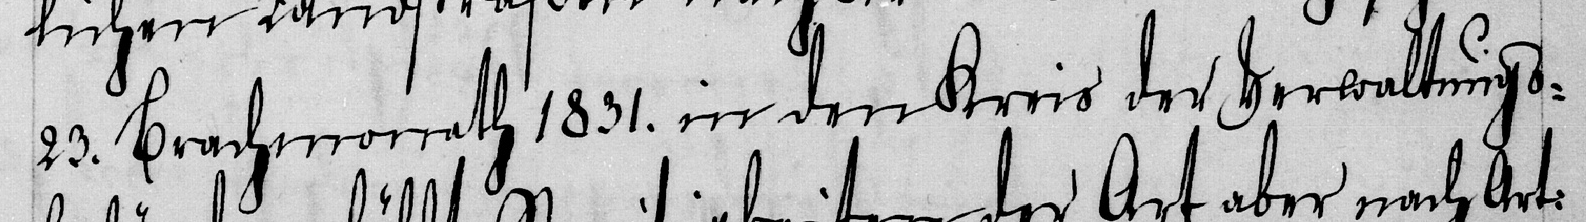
23. Brachmonath 1831. in den Kreis der Verwaltungs¬
